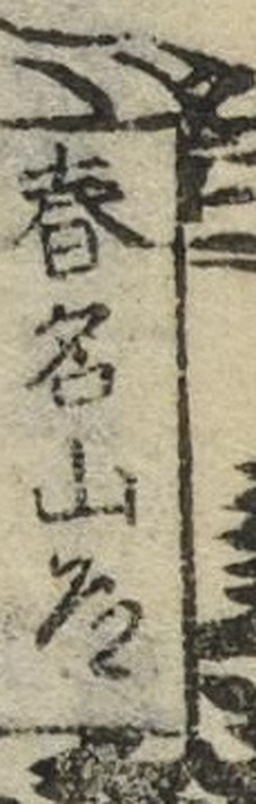春名山道
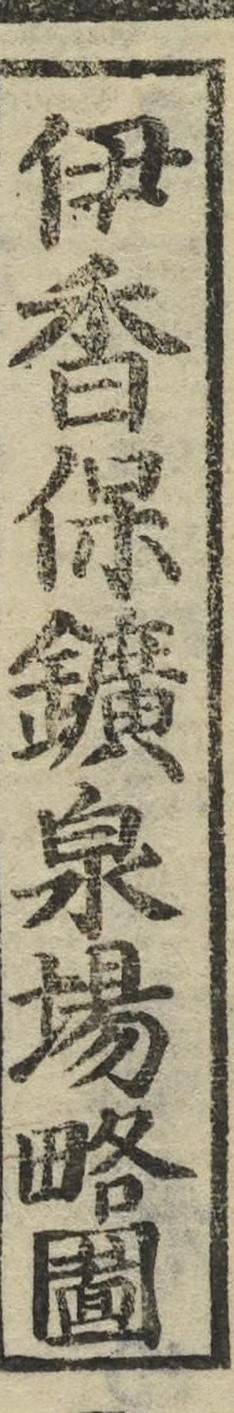伊香保鉱泉場略図
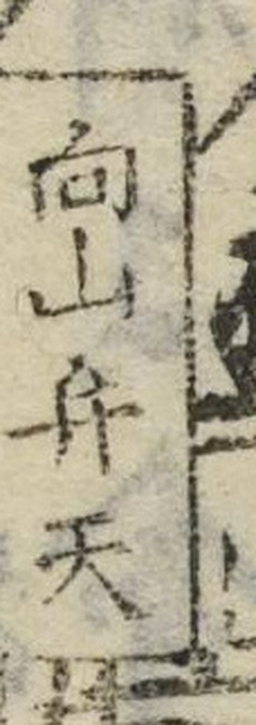向山弁天
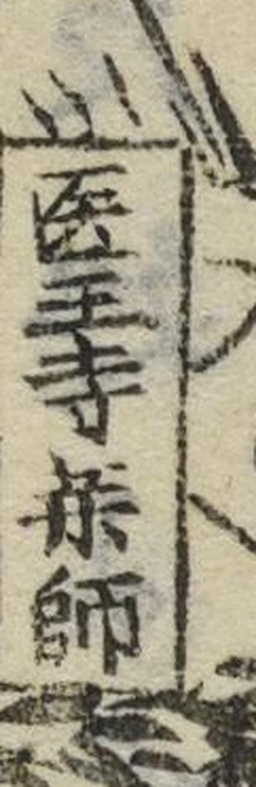医王寺薬師
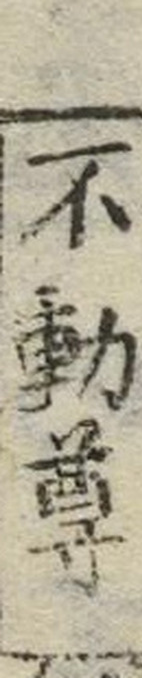不動尊
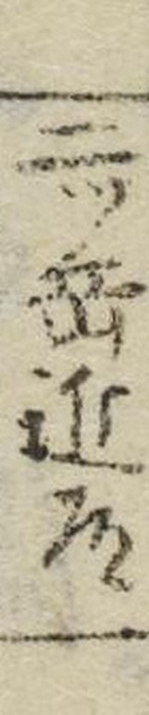二ッ岳近道
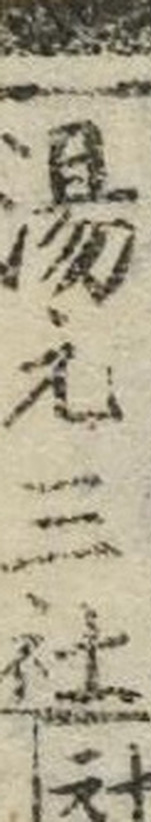湯元三社
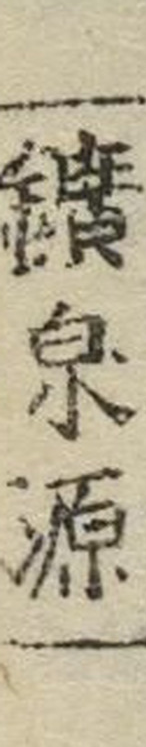鉱泉源
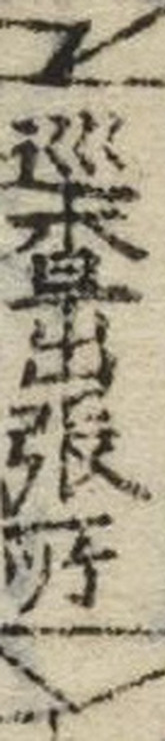巡査出張所
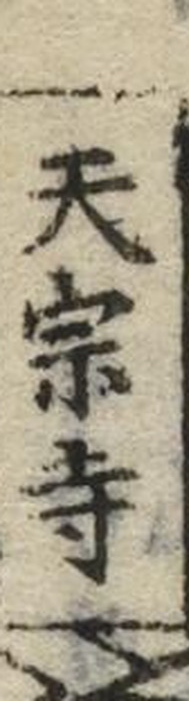天宗寺
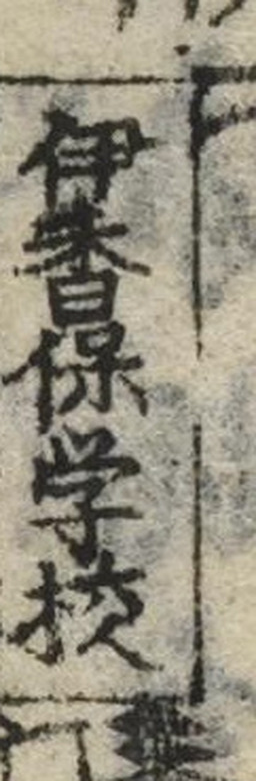伊香保学校
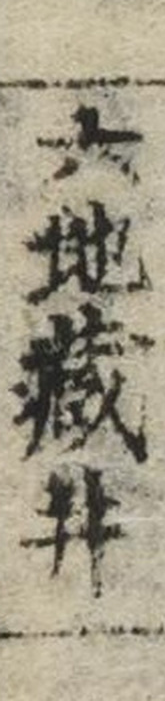六地蔵井
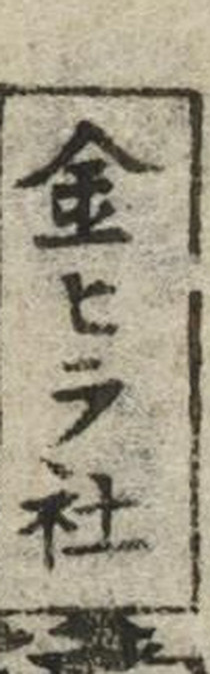金ヒラ社
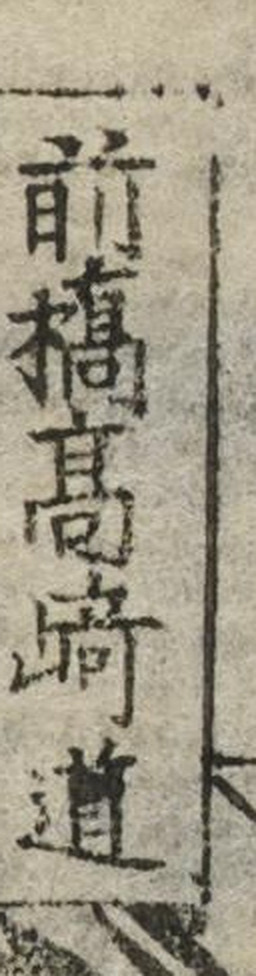前橋高崎道
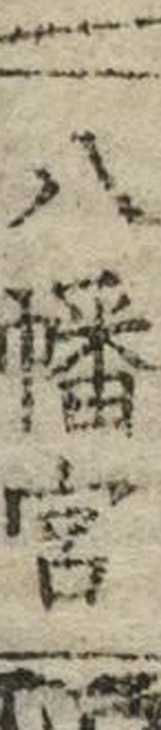八幡宮

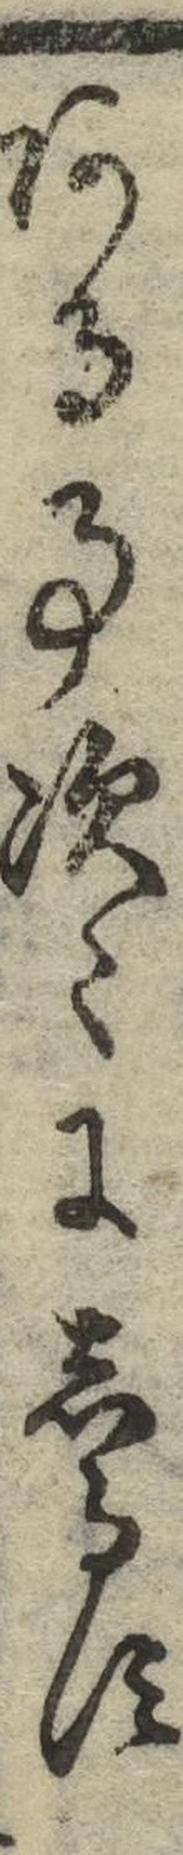ある事次々にしるす
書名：上州伊香保鑛泉圖會　全
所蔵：東京大学地震研究所図書室 Earthquake Research Institute Library, The University of Tokyo, JAPAN
